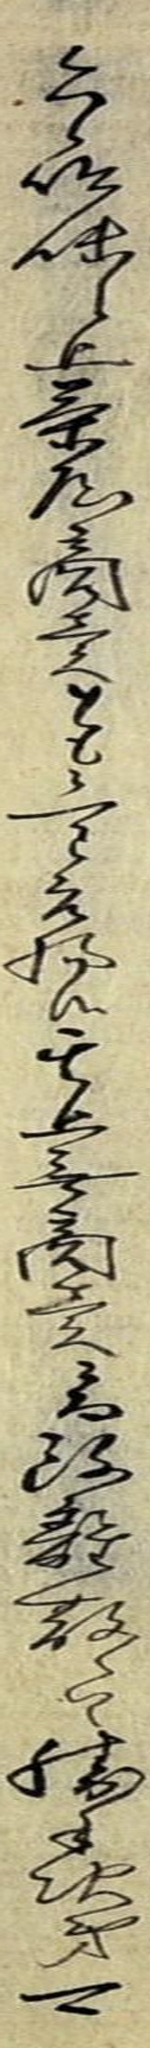候ハヽ吟味之上茶屋商売ともニ可被取揚候其上無商売ニ而致離散候ハヽ勝手次第可
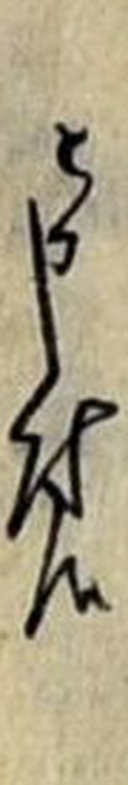被申付候
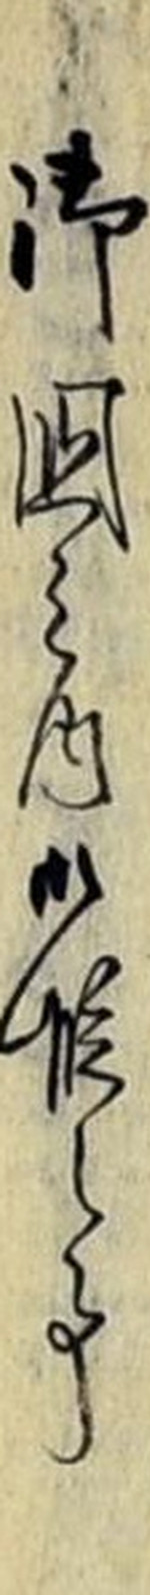御国之内御暇之事
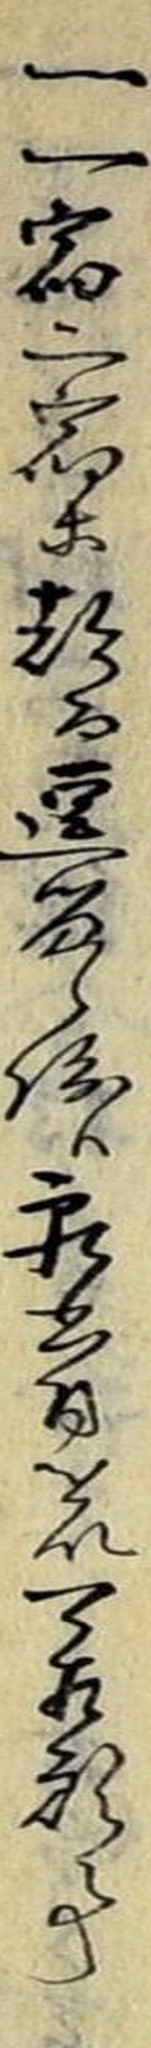一一宿二宿等都而逗留之儀ハ願書付を以可相願事
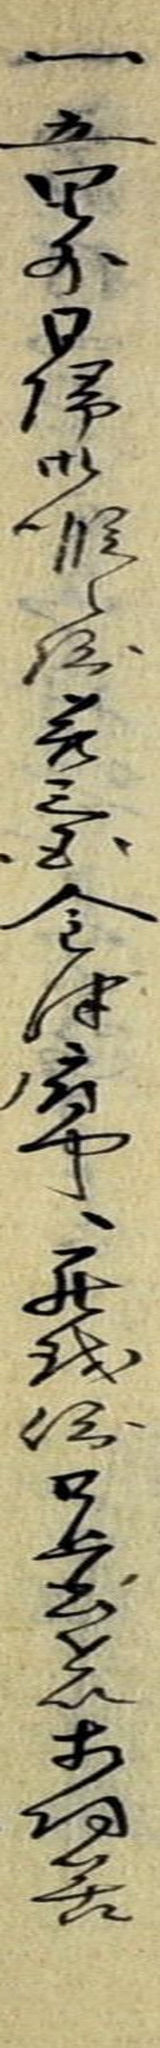一五里外日帰御暇之儀并三国金津府中へ罷越儀口上書を以相伺筈
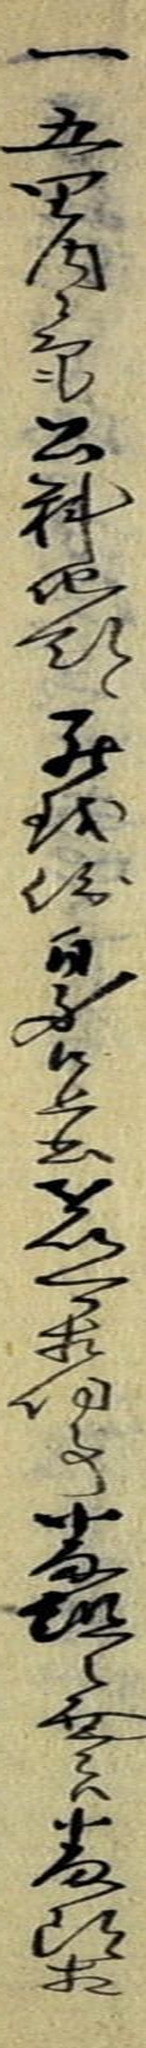一五里内ニ而も公料他領へ罷越儀自身口上書を以可相伺事番組之面々ハ番頭相
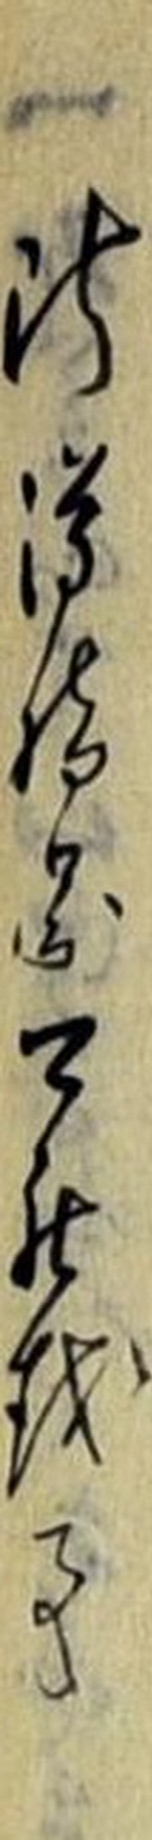断得指図可罷越事
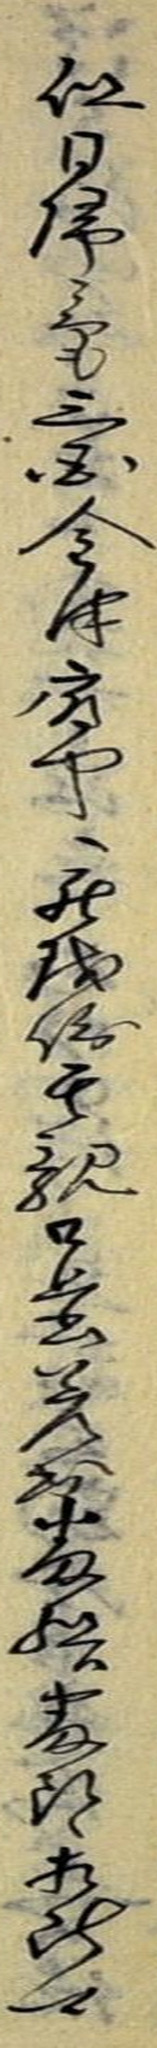但日帰ニ而も三国金津府中へ罷越儀其親口上書差出番組ハ番頭へ相断可
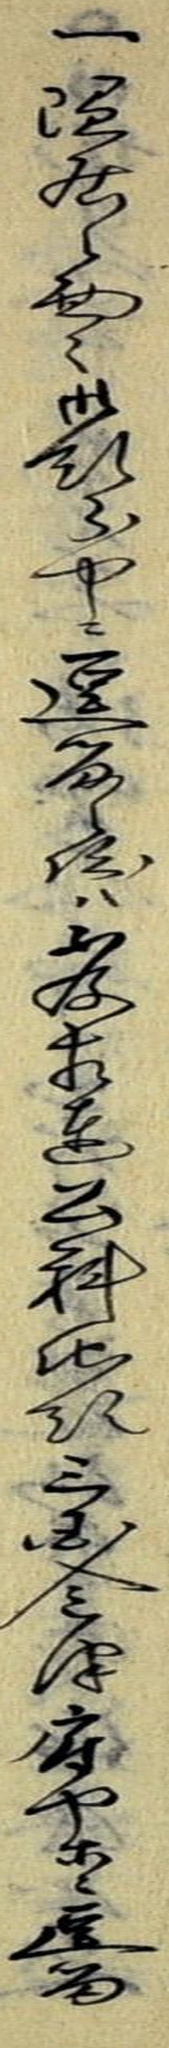一隠居之面々御領分中ニ逗留之儀ハ不及相達公料他領三国金津府中等ニ逗留
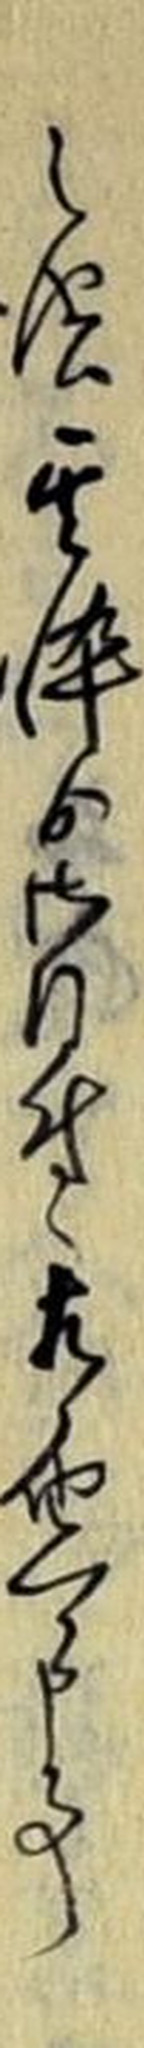之儀ハ其忰ゟ御目付へ相届可申事
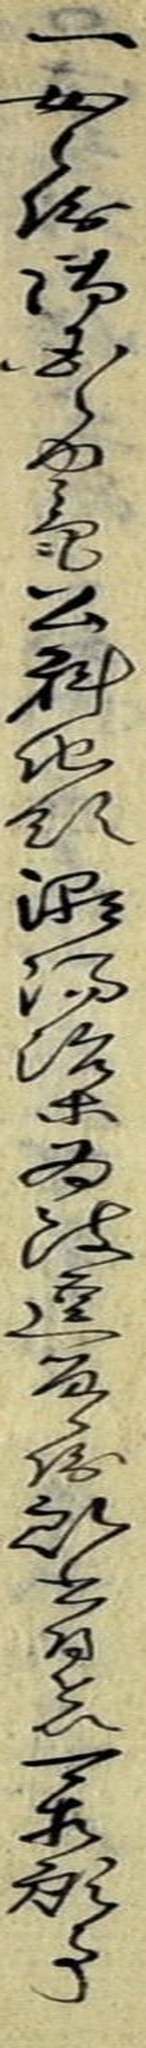一女之儀御国之内ニ而も公料他領潮湯治等為致逗留候儀願書付を以可相願事
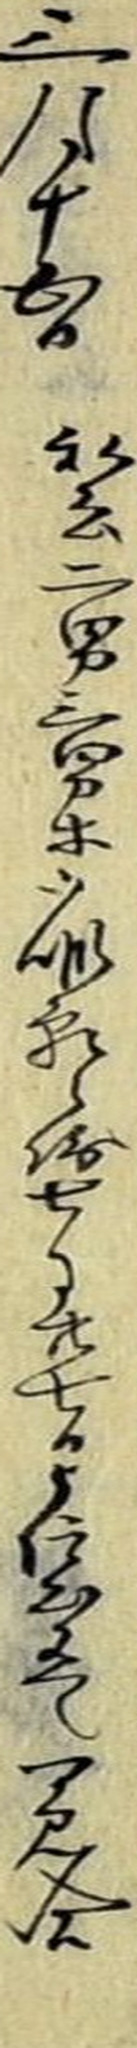三月十五日私云二男三男等御暇願之儀七月廿七日被仰出有之可見合
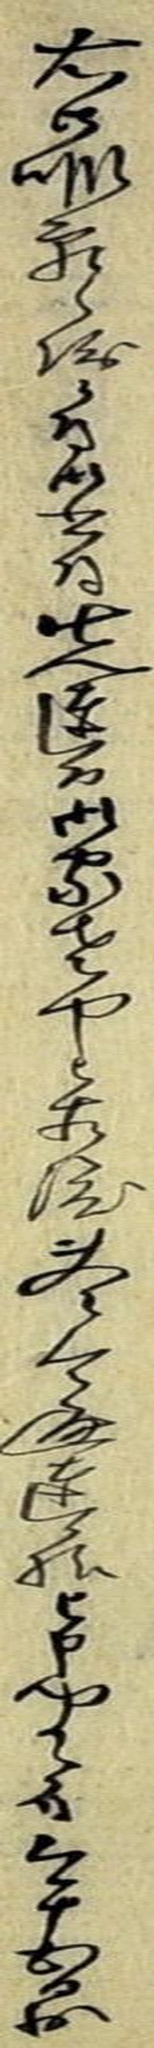右御暇願之儀ニ付御書付先達而御家老中被相渡夫々可通達候様被申聞候ニ付今十五日於
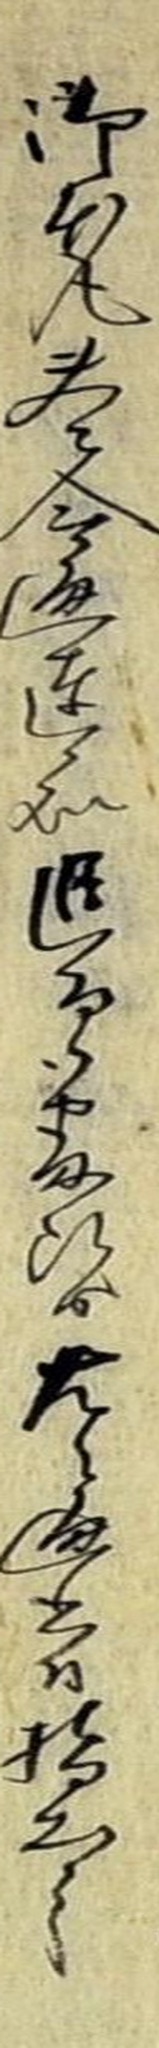御本丸夫々令通達候処追而御番頭ゟ左之通書付指出之
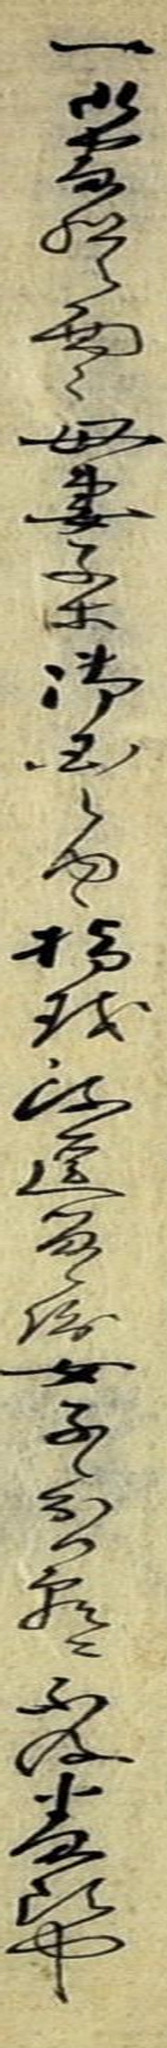一御番組之面々母妻子等御国之内へ指越致逗留候儀女子之分ハ願ニ不及番頭中
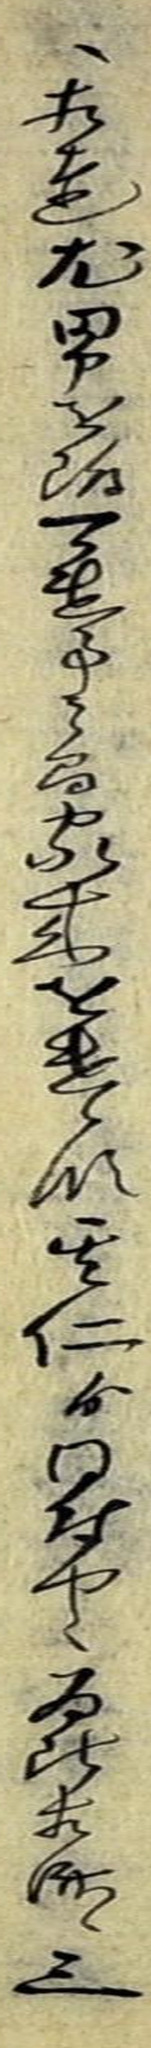へ相達尤男を付可遣事ニ候間家来を遣候段其仁ゟ目付中へ為断相済候三
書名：命令之部 三
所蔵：福井県文書館 Fukui Prefectural Archives
